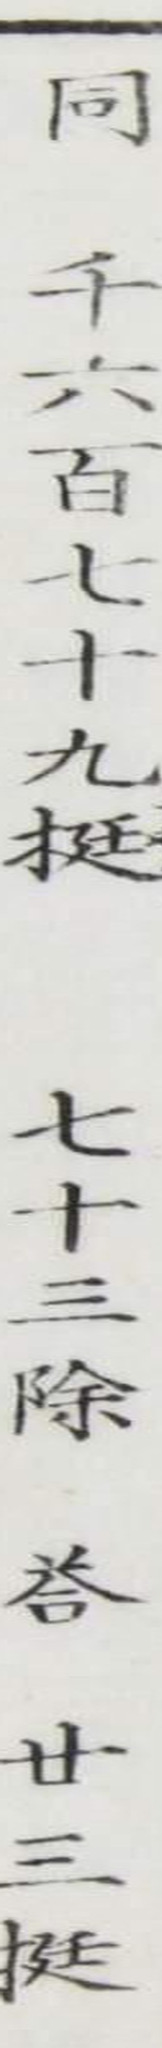同千六百七十九挺七十三除答廿三挺
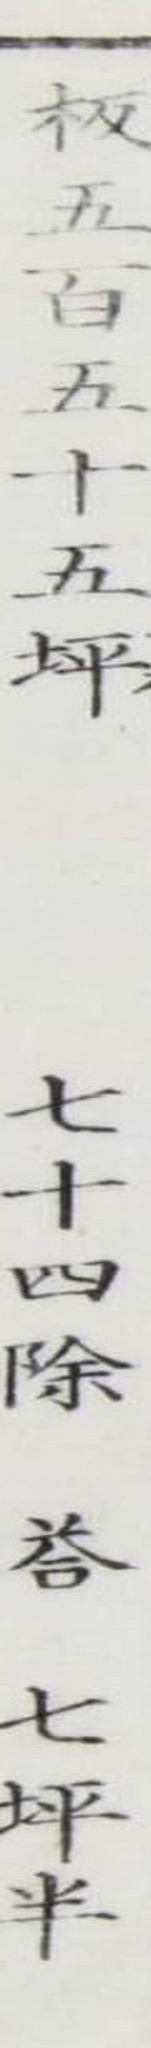板五百五十五坪七十四除答七坪半
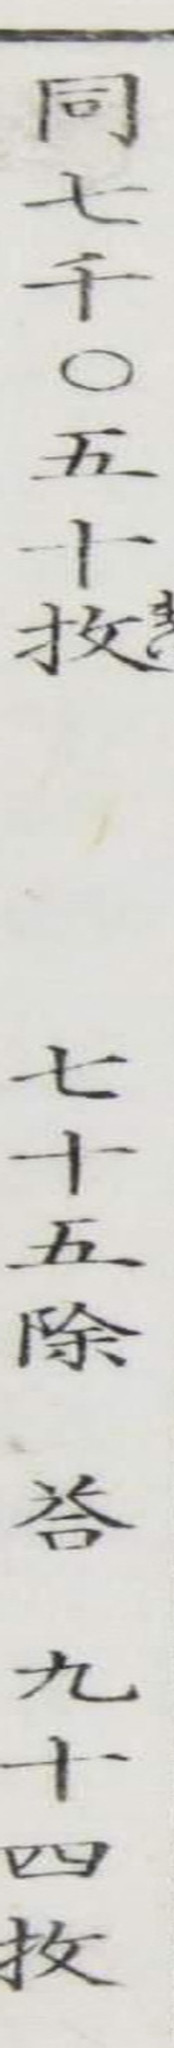同七千〇五十枚七十五除答九十四枚
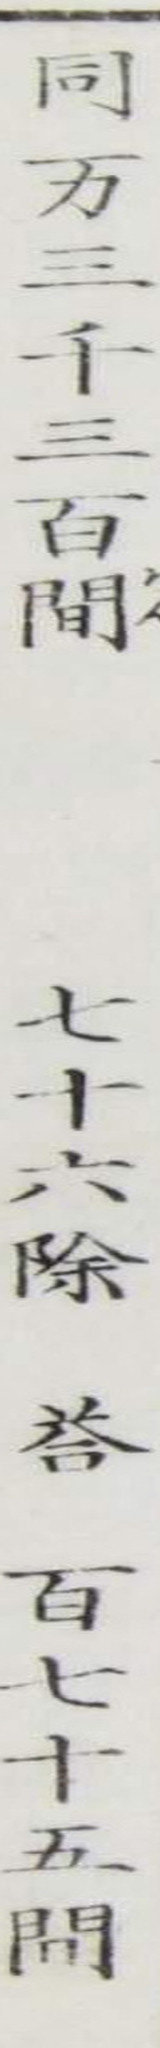同万三千三百間七十六除答百七十五間
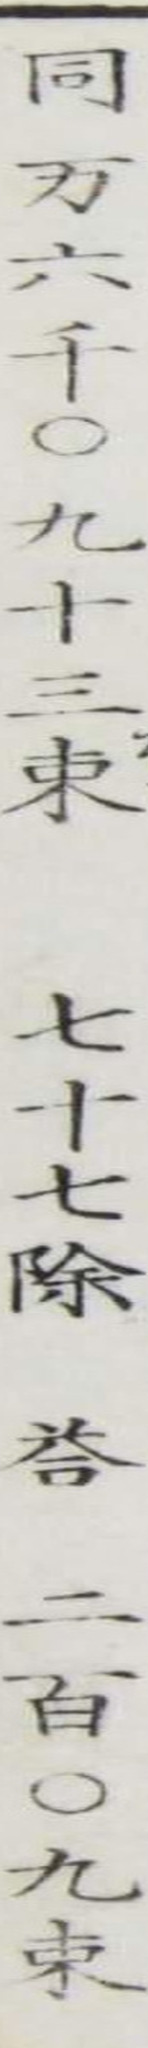同万六千〇九十三束七十七除答二百〇九束

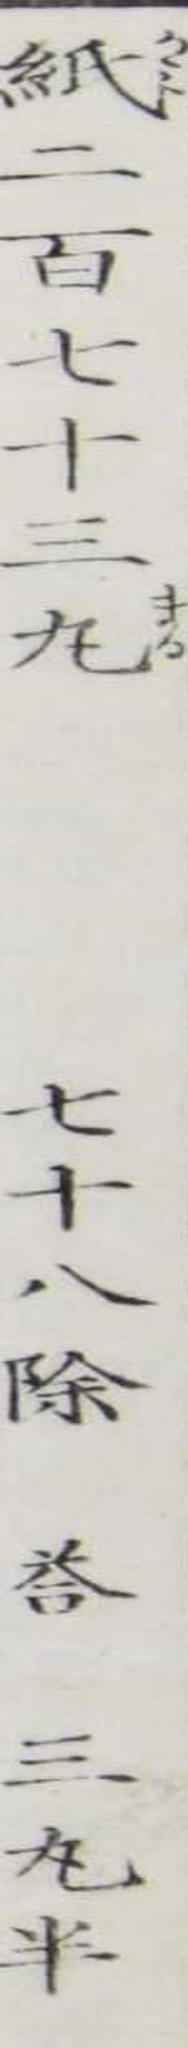紙二百七十三丸七十八除答三丸半
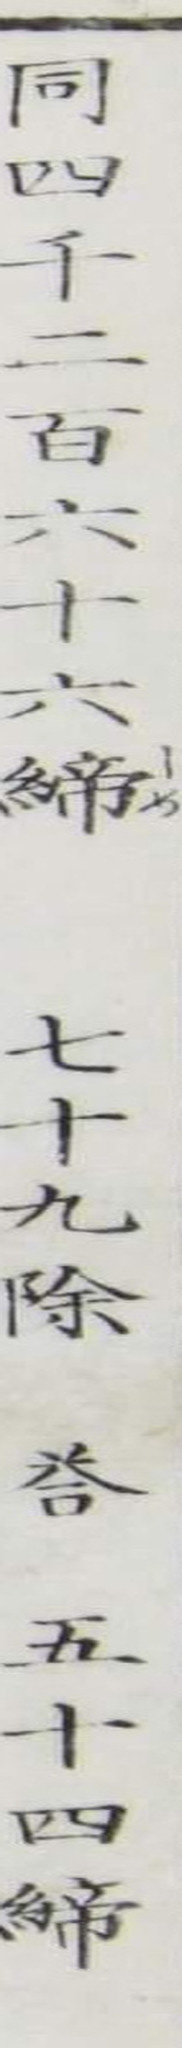同四千二百六十六締四十九除答五十四締
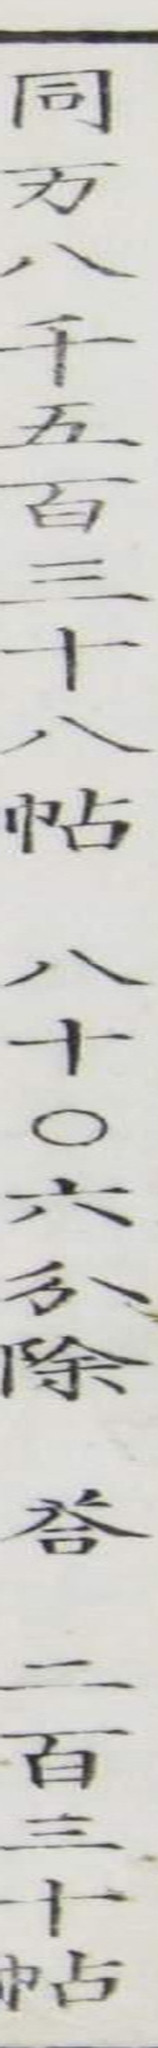同万八千五百三十八帖八十〇六分除答二百三十帖
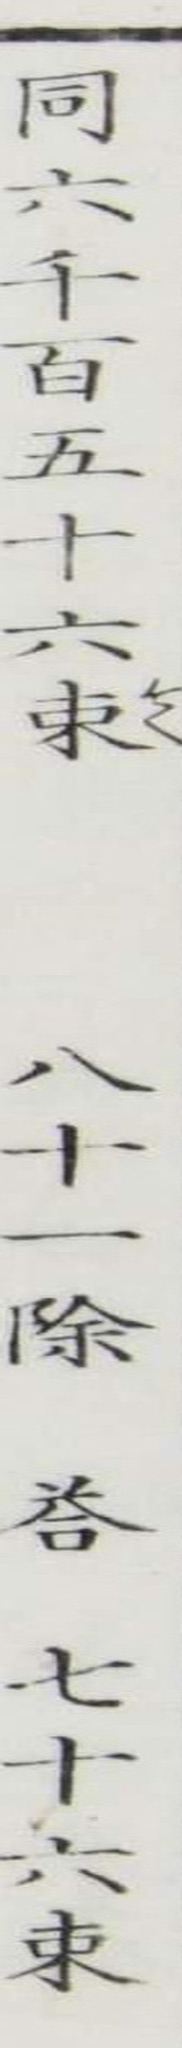同六千百五十六束八十一除答七十六束
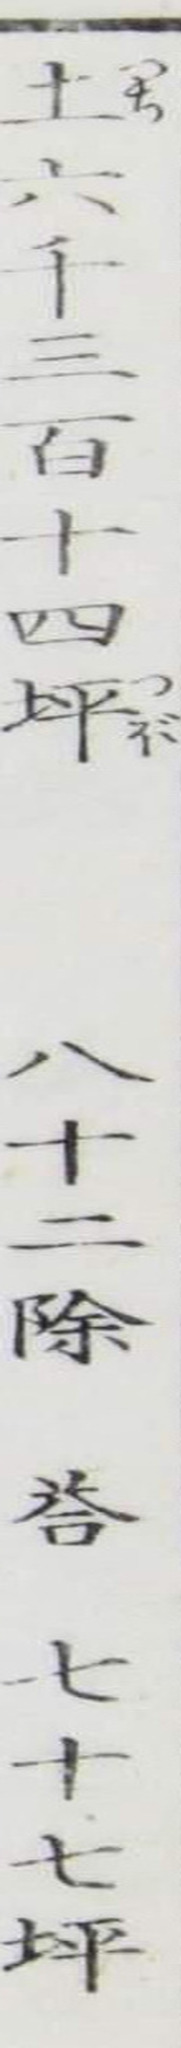土六千三百十四坪八十二除答七十七坪
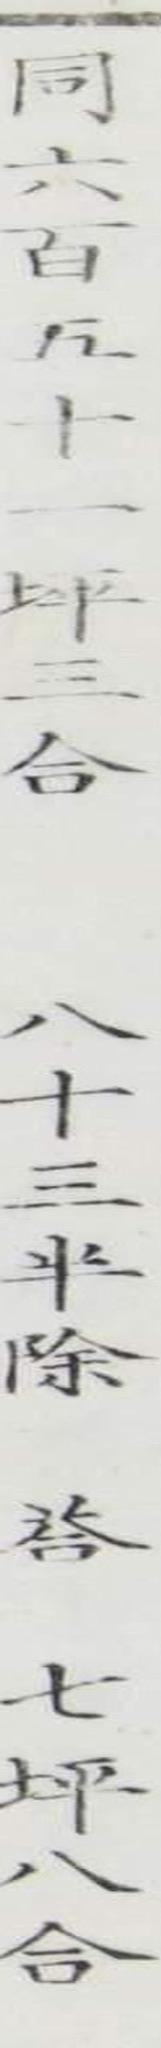同六百五十一坪三合八十三半除答七坪八合
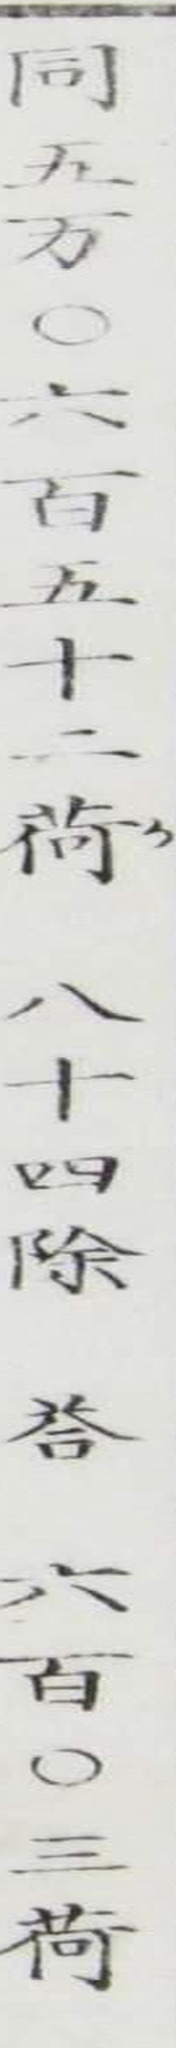同五万〇六百五十二荷八十四除答六百〇三荷
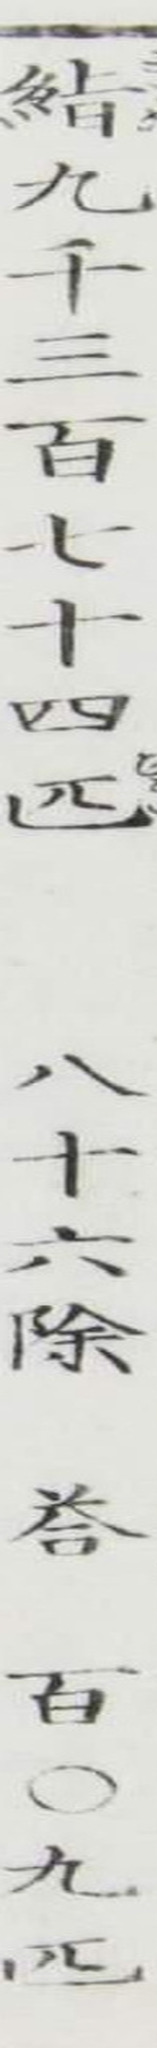絹九千三百七十四匹八十六除答百〇九匹
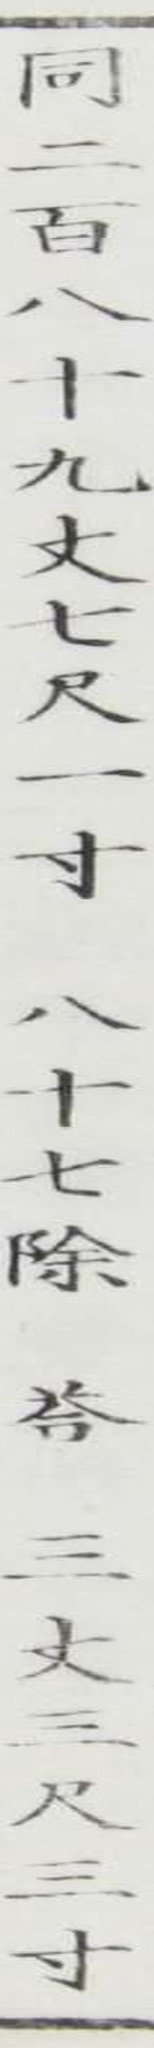同二百八十九丈七尺一寸八十七除答三丈三尺三寸
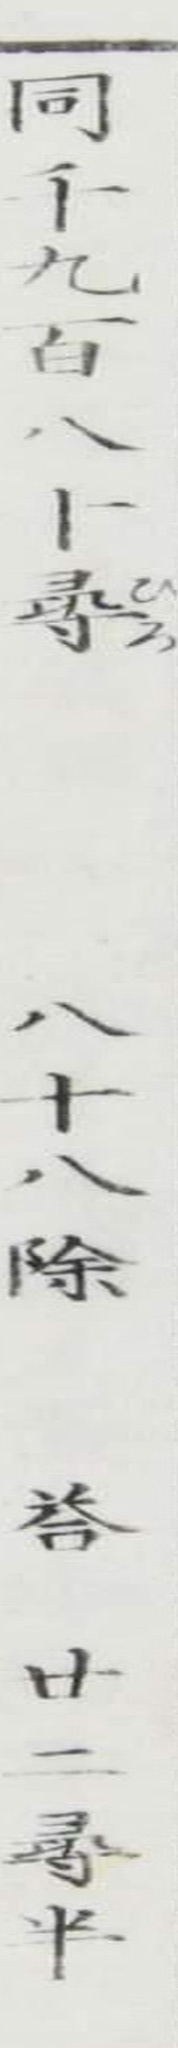同千九百八十尋八十八除答廿二尋半
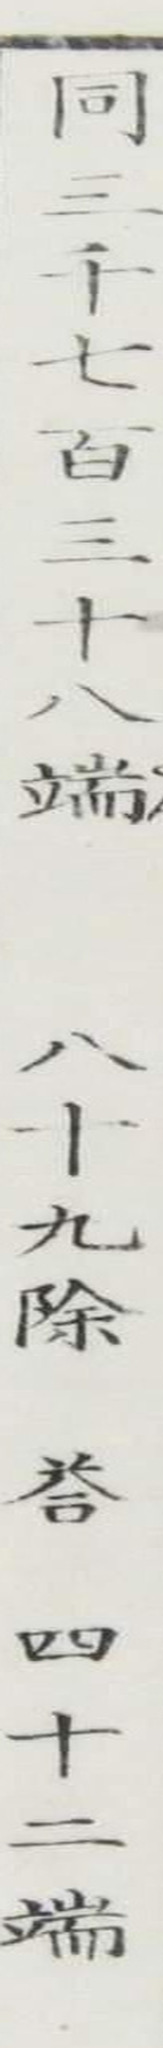同三千七百三十八端八十九除答四十二端
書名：明治小學塵劫記 卷1
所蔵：東京学芸大学教育コンテンツアーカイブ
